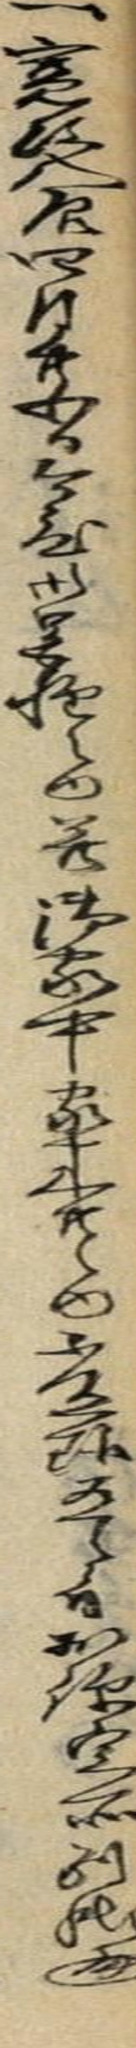一寛政八辰四月廿五日今度御足軽之内并御家中家来共之内不宜趣有之候付於評定所別紙之通
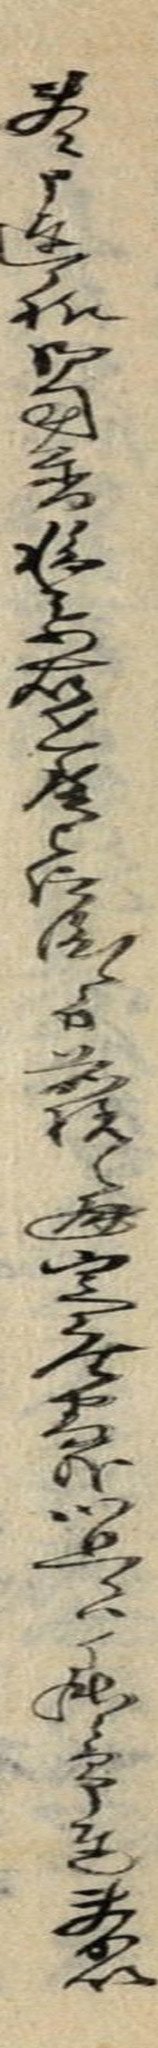夫々申達候様御用番稻葉右近殿被仰渡候に付前説之通定座番外以上へは手紙に而申達夫ゟ以
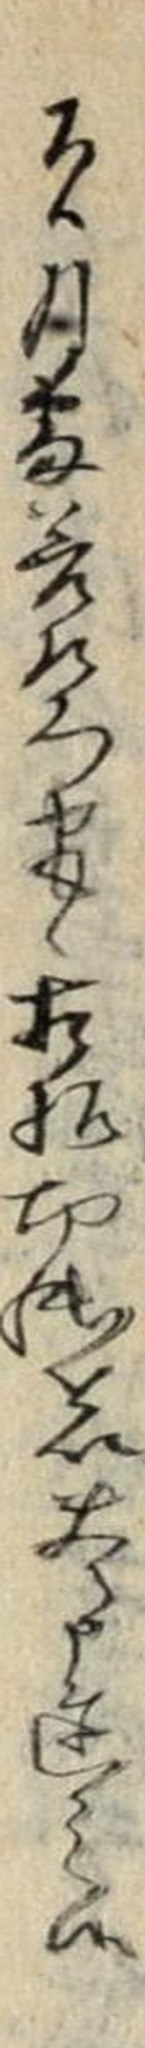下は月番善左衛門宅へ相招切紙を以夫々申達之候
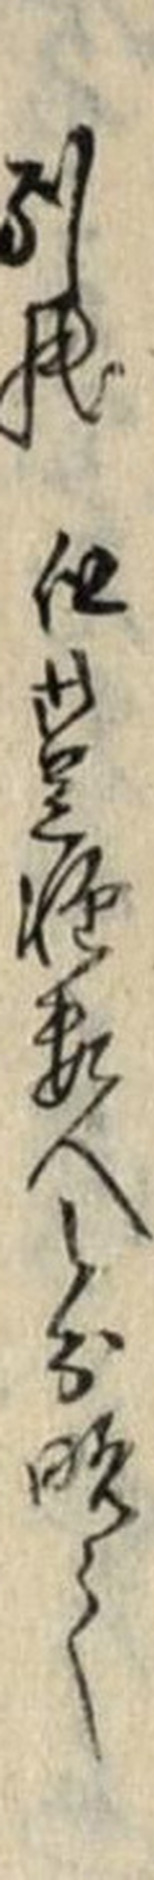別紙但御足軽数人之分略之
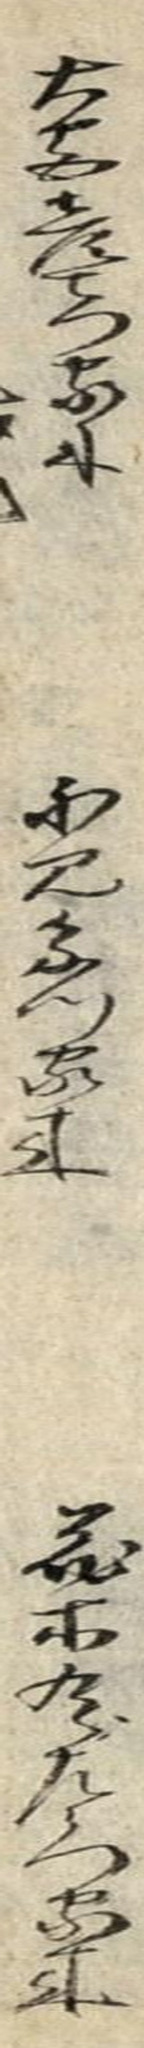大宮彦右衛門家来永見多門家来花木九郎左衛門家来
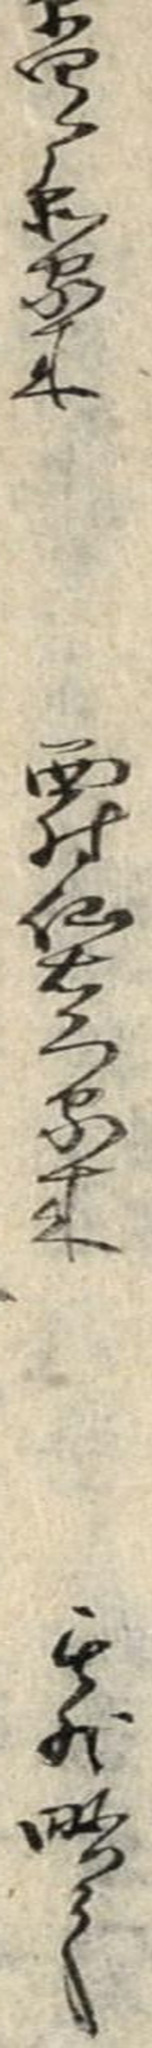松原四郎兵衛家来西村仙右衛門家来其外略之
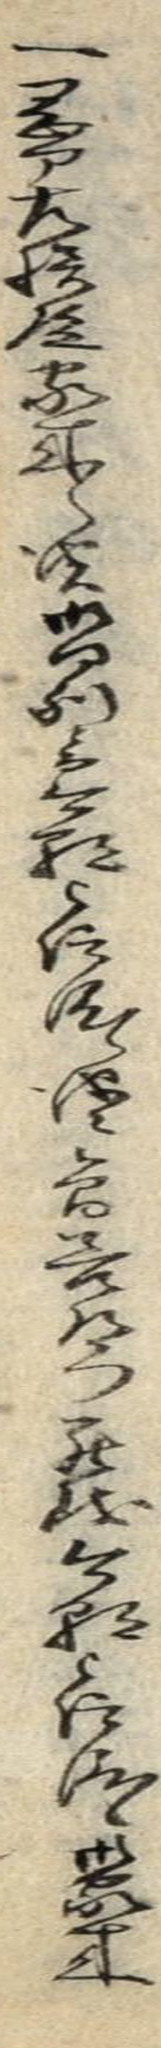一岡部左膳殿家来之儀は御同列に而今朝被仰渡候儀に候間善左衛門罷越今朝被仰渡候御家来
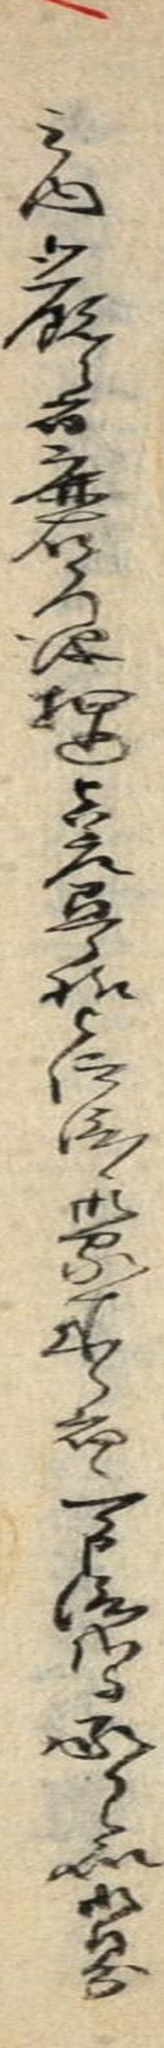之内御厩之者廉右衛門儀押込被差置候様被仰渡候御家来之者へ可申渡哉と承候処御自分

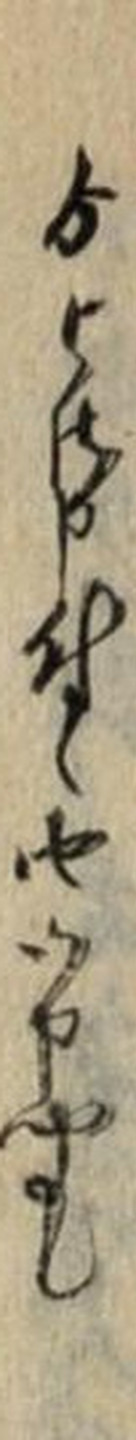ゟ被御申付候由御申聞候
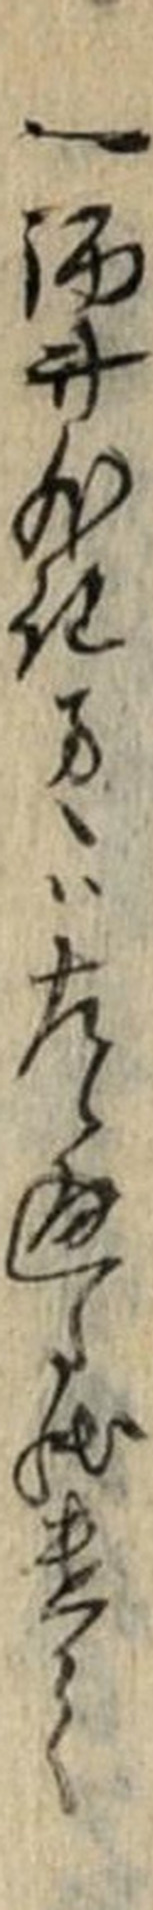一酒井外記方へは左之通手紙遣之
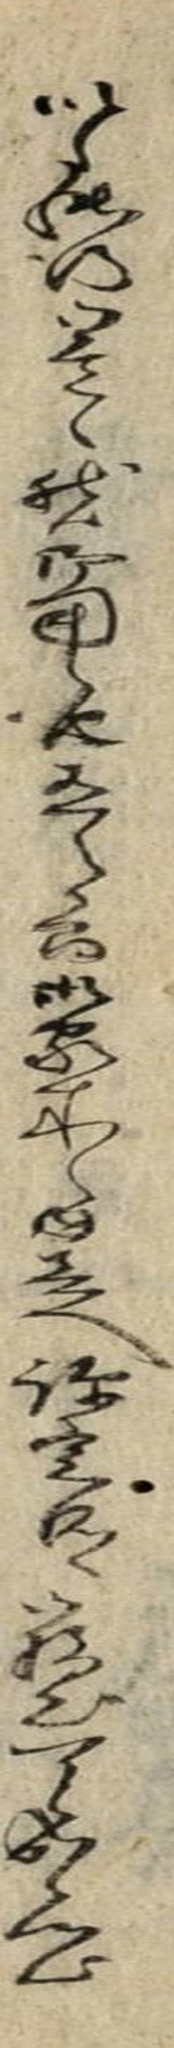以手紙得御意候然は御用之儀有之候間御家来之内壱人評定所へ御指出可被成候以上
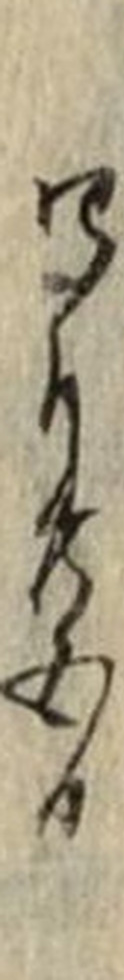四月廿五日
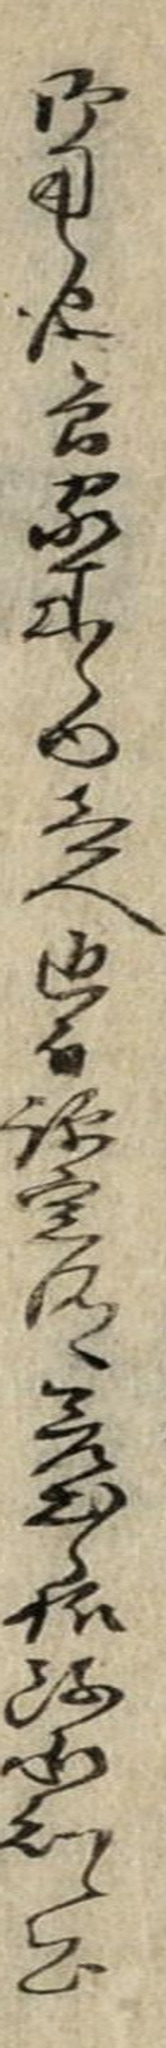御用之儀に候間家来之内壱人追而評定所へ差出候様致承知候以上
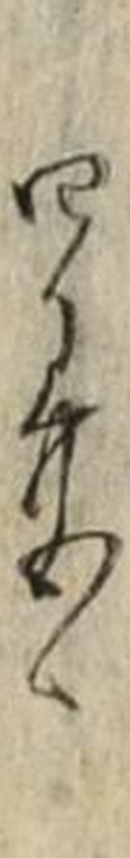四月廿五日
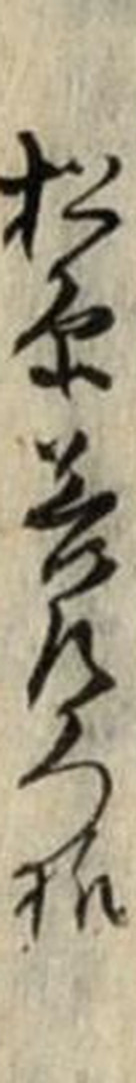誰殿松原善左衛門
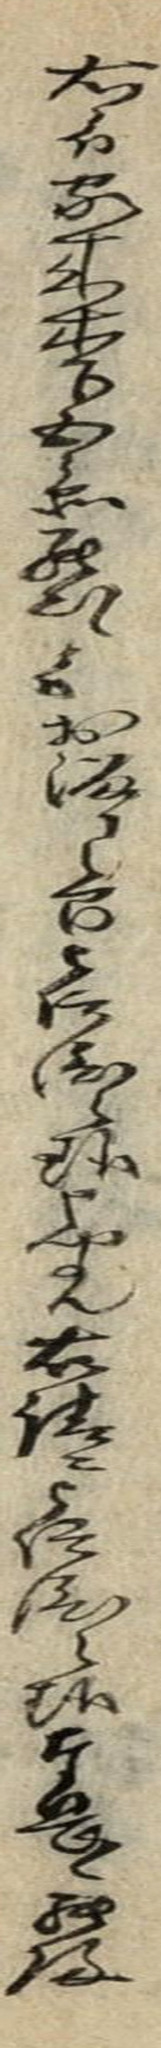右に付家来木下五兵衛罷出候に付於溜り之間被仰渡候趣申聞る右請に被仰渡候趣奉畏候罷帰
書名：蒐輯之部
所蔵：福井県文書館 Fukui Prefectural Archives
